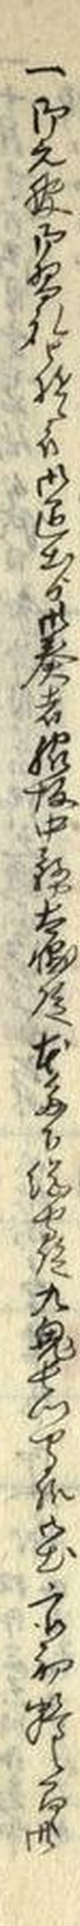一御元服御習礼被遊候ニ付御退出ゟ御奏者脇坂中務大輔殿本多下総守殿九鬼長門守様御出最初鶴之間へ御
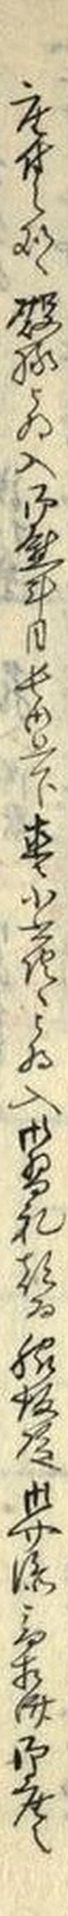座付之処殿様被為入御熨斗目長御上下直ニ小書院へ被為入御習礼都而脇坂殿御介添ニ而相済御座之
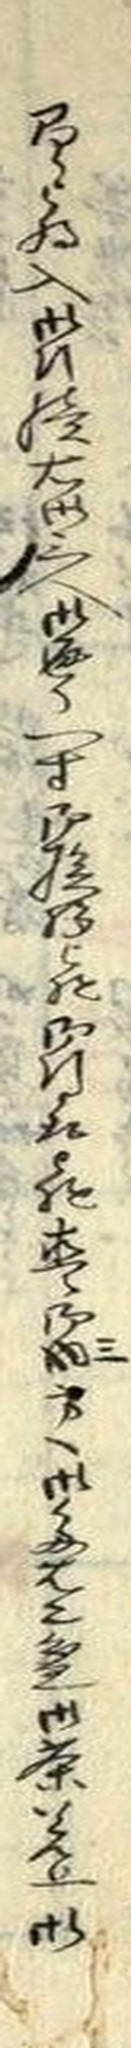間へ被為入御引続右御三人御通り一寸御挨拶被遊御引取被遊直ニ御三方へ御たはこ盆御茶差上御
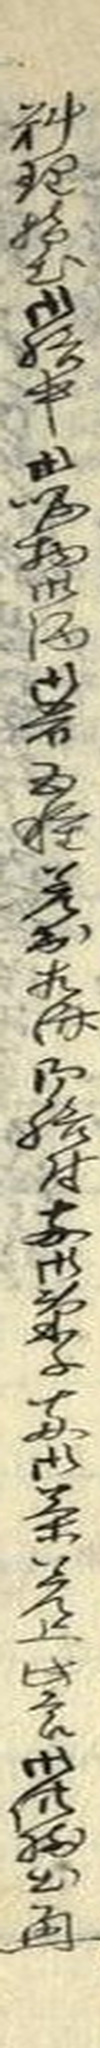料理指出御膳中御吸物御酒御肴五種差出相済御膳付両御菓子両御茶差上此節御供揃出再
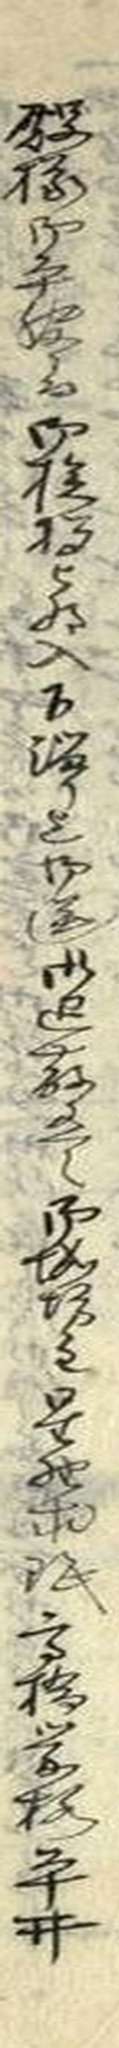殿様御平服ニ而御挨拶被為入下溜り迄御送御退散有之御城坊主星野求珉高橋栄格平井
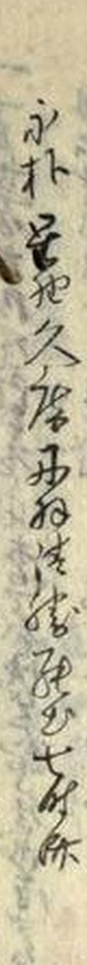永朴星野久庵丹羽清勝罷出七時済
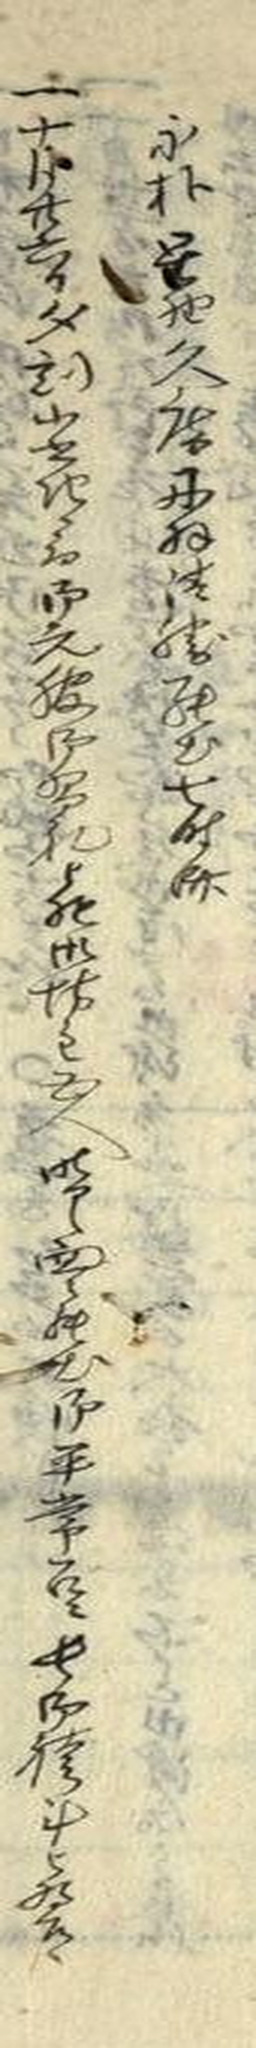一十月廿六日夕刻小書院ニ而御元服御習礼被遊御坊主五人昨日之面々罷出御平常召ニ長御袴計被為召候

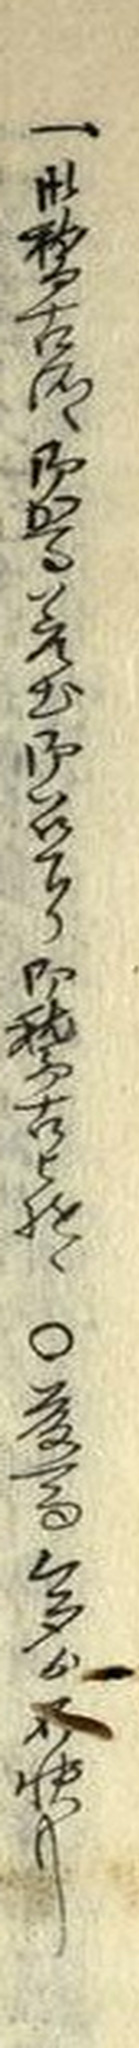一御稽古所へ御駕差出御召下り御稽古被遊候〇藤馬今夕ゟ不快引
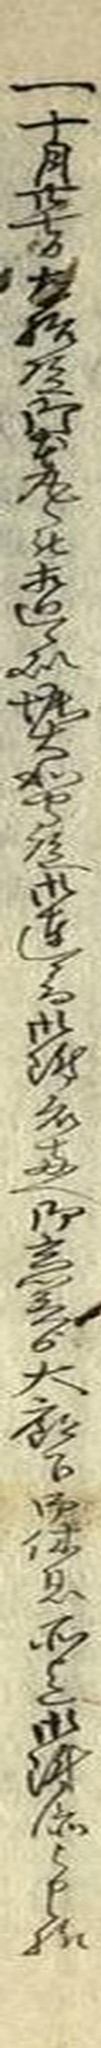一十月廿七日左膳殿本丸へ被相廻候処堀大和守殿御達ニ而御附衆両人御玄関ゟ大廊下御休息所迄御附添被申候様
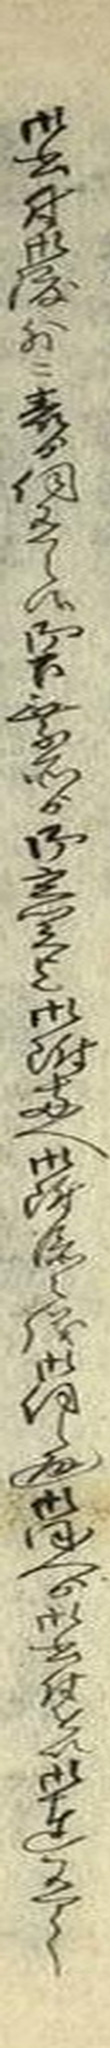御書付御渡外ニ表ゟ伺有之候御下乗所ゟ御玄関迄御附両人御附添之儀御伺之通御同人ゟ御書付を以御達有之
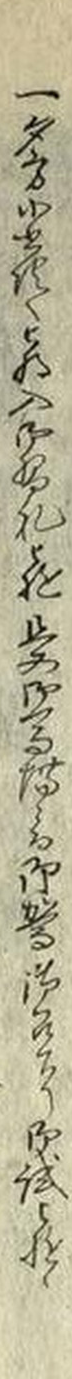一夕方小書院へ被為入御習礼被遊且又御馬場ニ而御駕御召下り御試被遊候
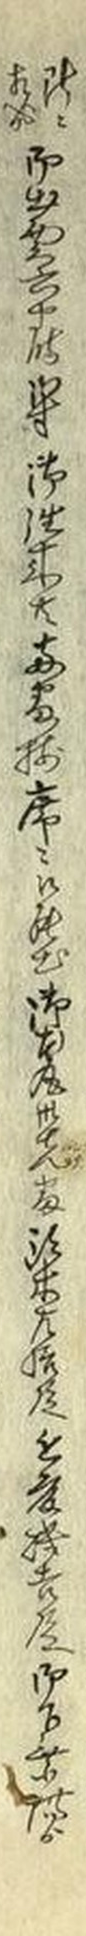相成御出殿六半時弐寸御往来共両番揃席ニ被罷出御本丸御先番鈴木左膳殿近藤磯吉殿御下乗場ゟ
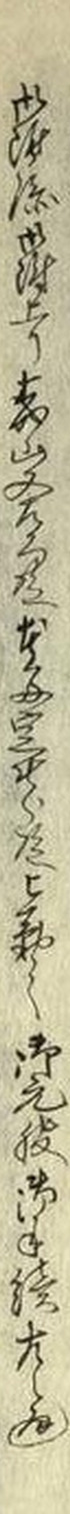御附添御附上り森山又左衛門殿本多定次郎殿被勤之御元服御手続左之通
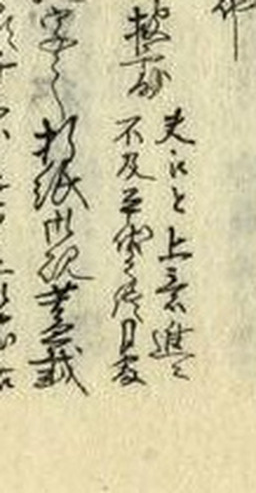不及平伏之儘月番
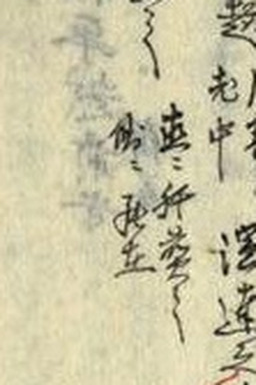側ニ罷在

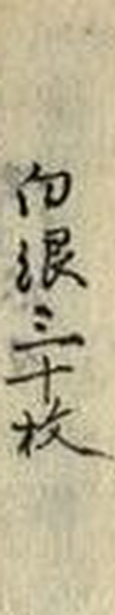白銀三十枚
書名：少傅日録抄（斉善付側向頭取日記、在府）
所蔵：福井県文書館 Fukui Prefectural Archives
